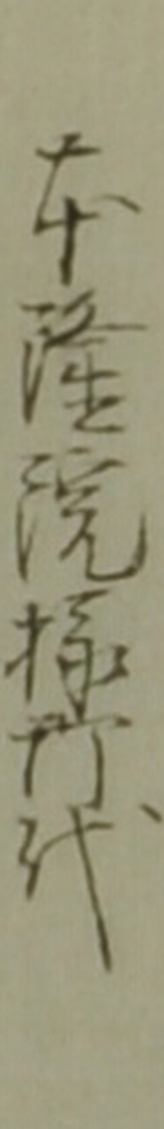本隆院様御代
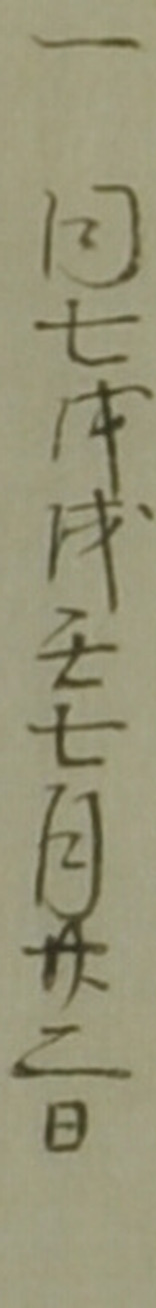一同七戊戌閏七月廿二日
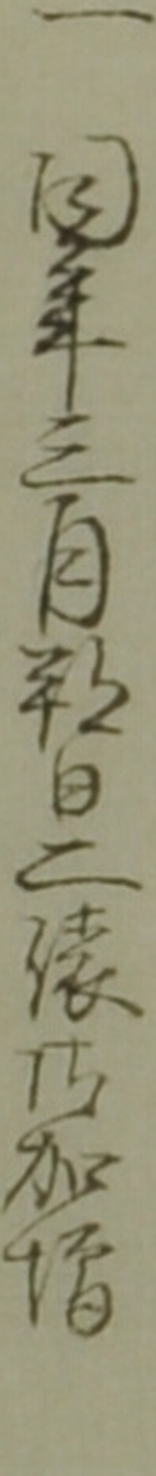一同年三月朔日二俵御加増
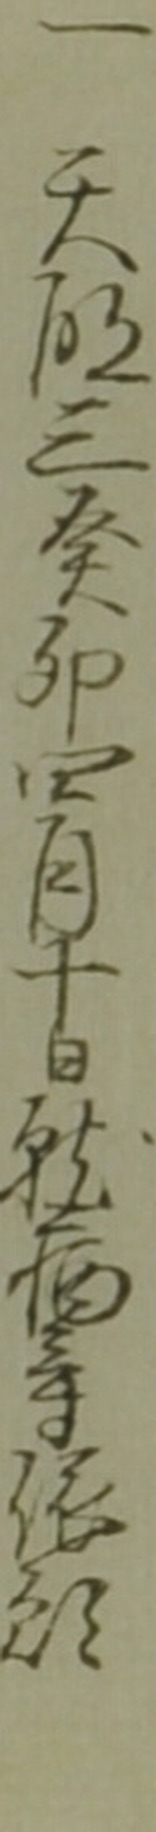一天明三癸卯四月十日就病気依願
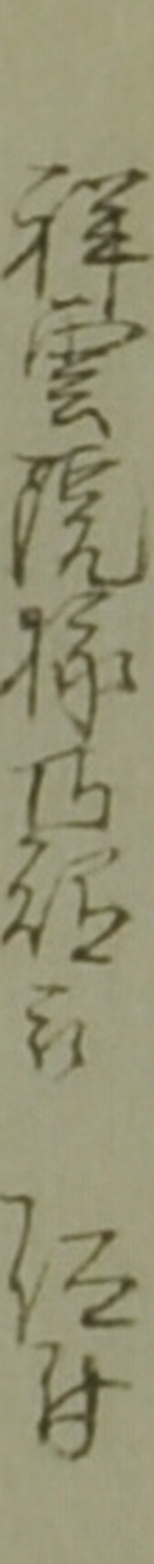祥雲院様御賄被仰付
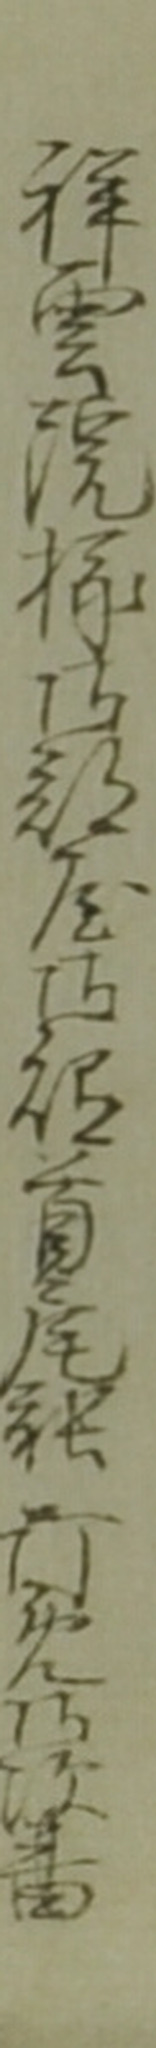祥雲院様御部屋御賄首尾能御免御次番
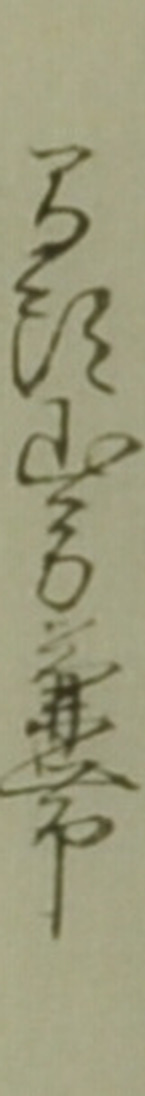間頭山方兼帯
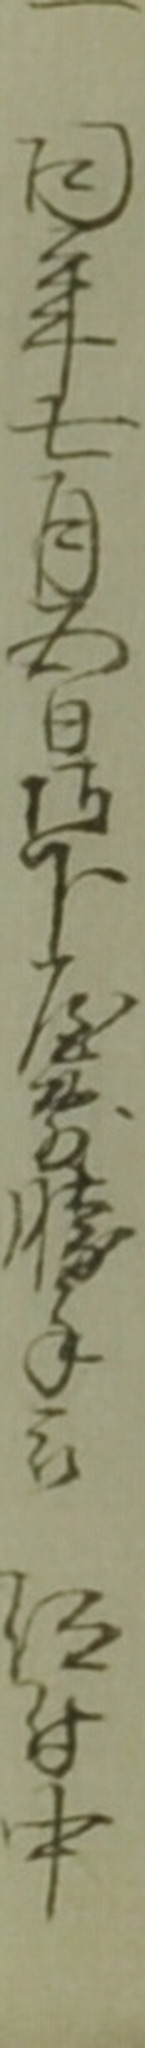一同年七月五日御下屋敷勝手被仰付中
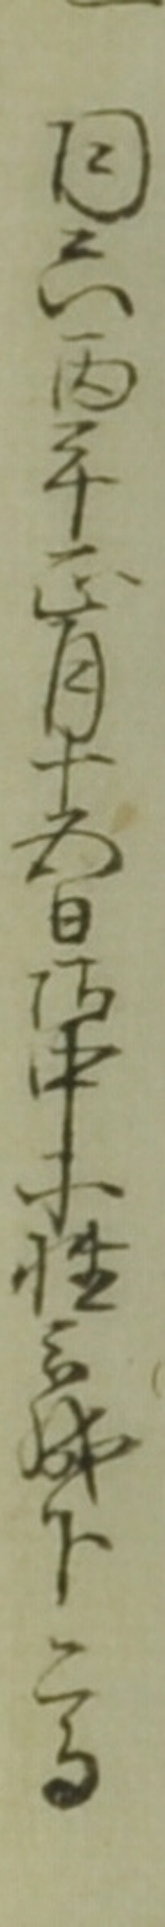一同六丙午正月十五日御中小性被成下高

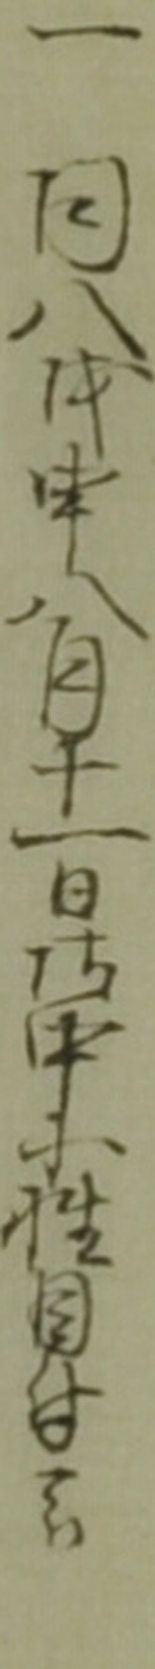一同八戊申八月十一日御中小性目付被
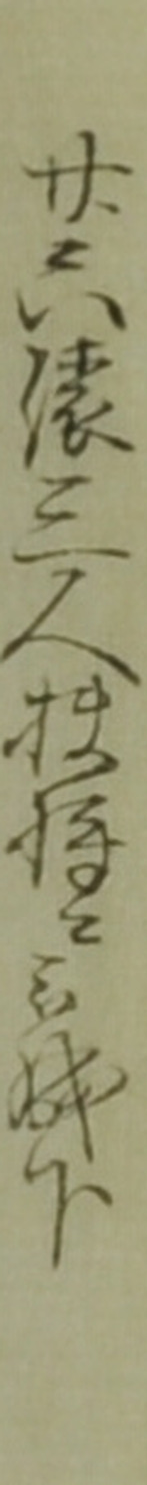廿六俵三人扶持ニ被成下
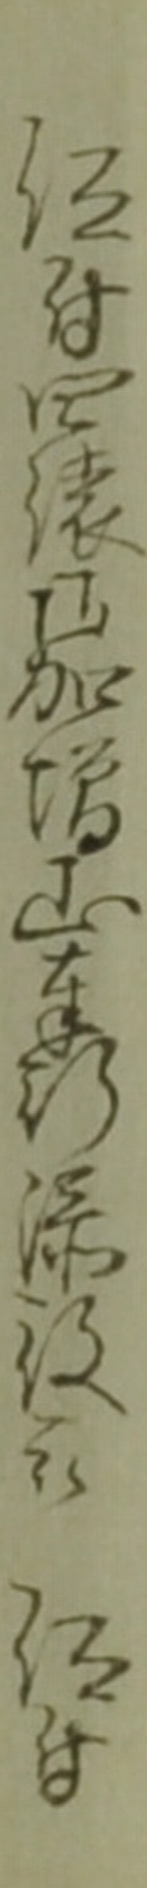仰付四俵御加増山奉行添役被仰付
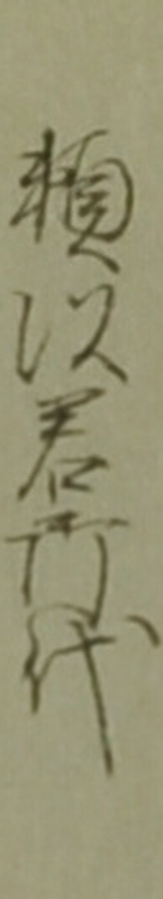頼以君御代
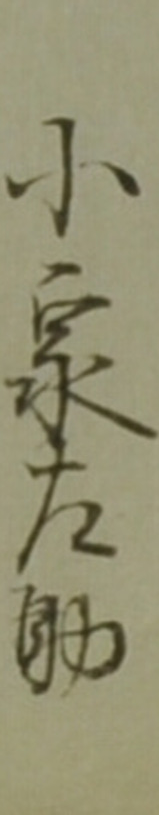小泉左助
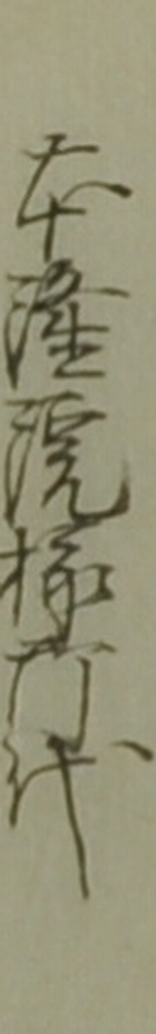本隆院様御代
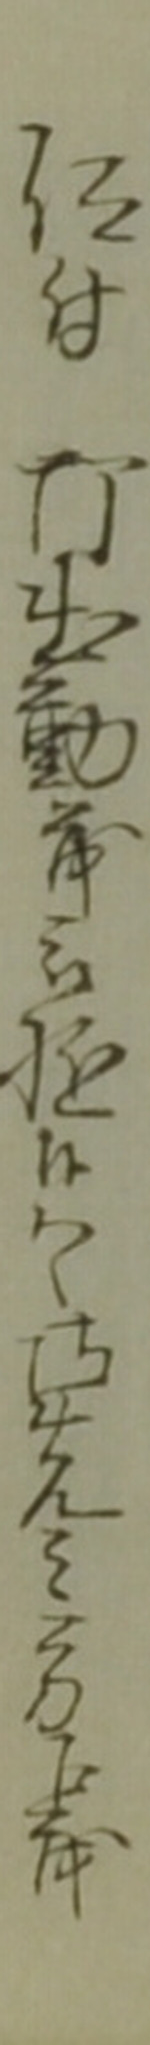仰付御出勤茂被遊候ハヽ御先之方江茂
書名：無足諸士勤仕録（一）
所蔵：伊那市立高遠町図書館・合同会社AMANE
